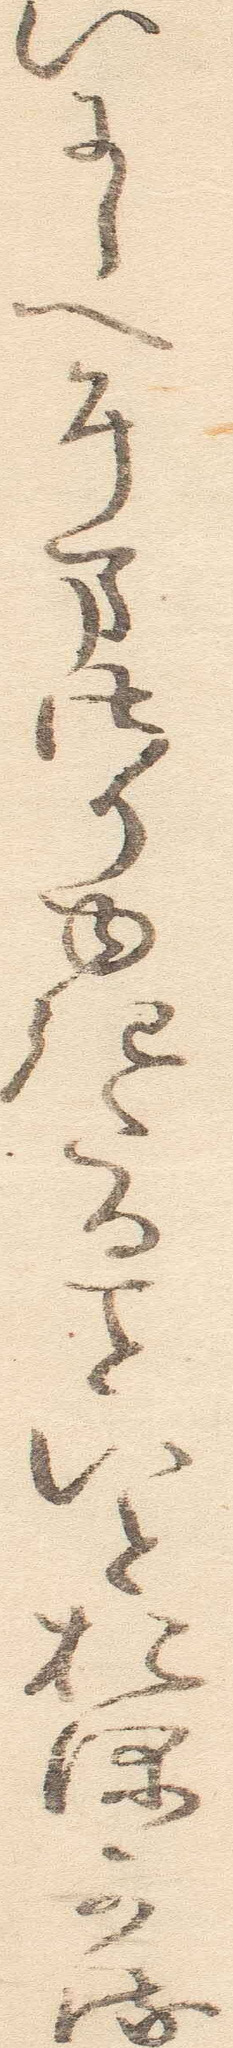いにしへにまさりゆきたることいとおほかる
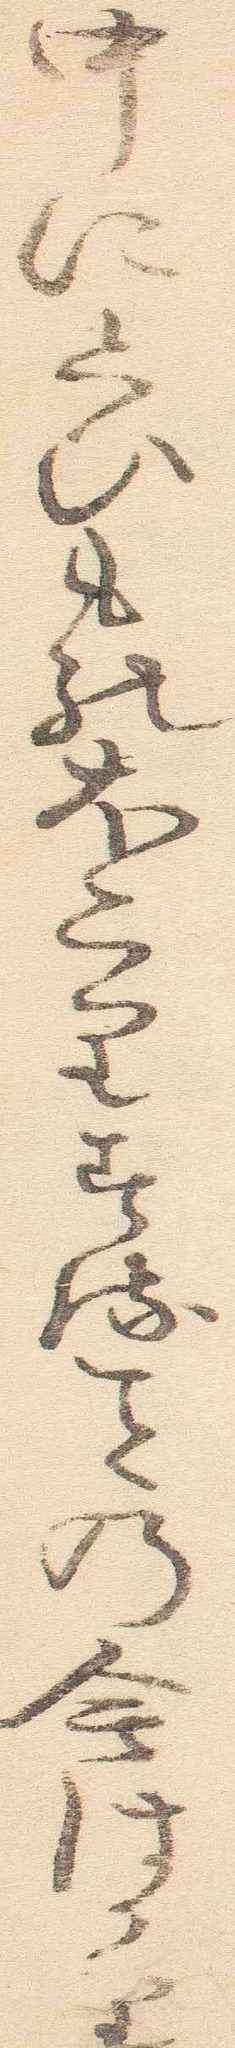中にくひものほこりすることの今はかり
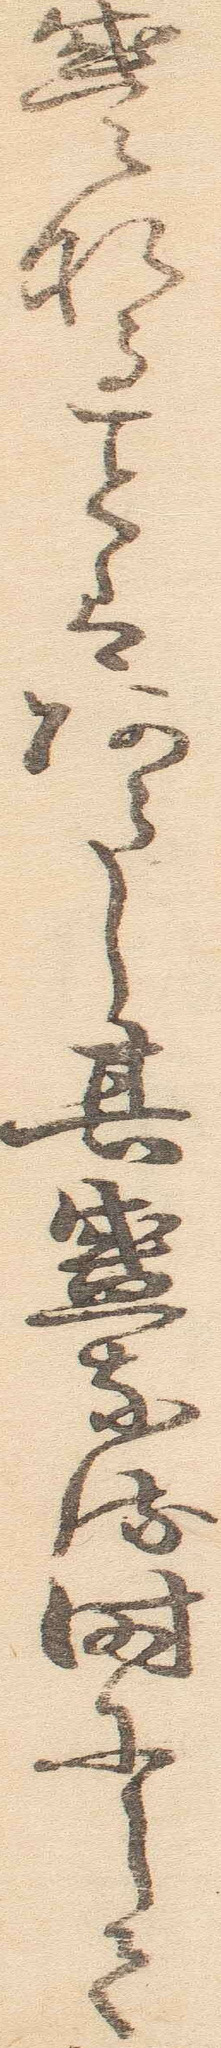盛なることはあらし其盛なる時にして

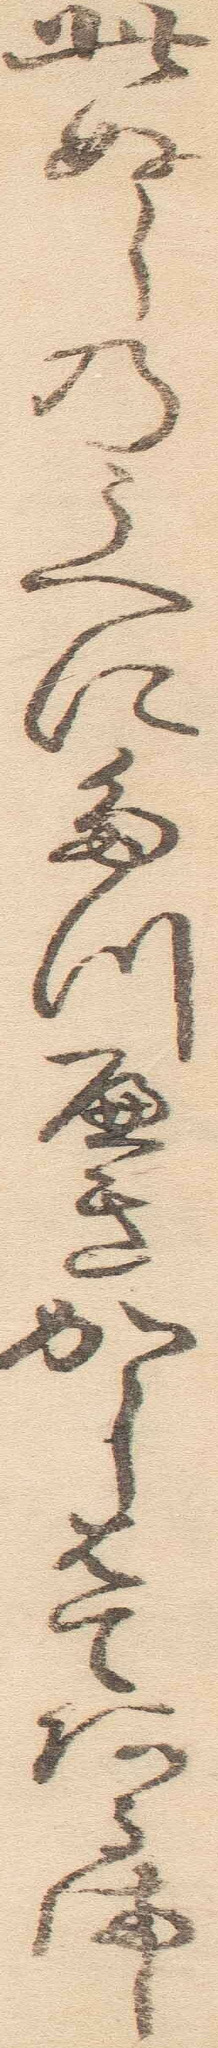此ぬしのうへにたつへきかしはてあるまし
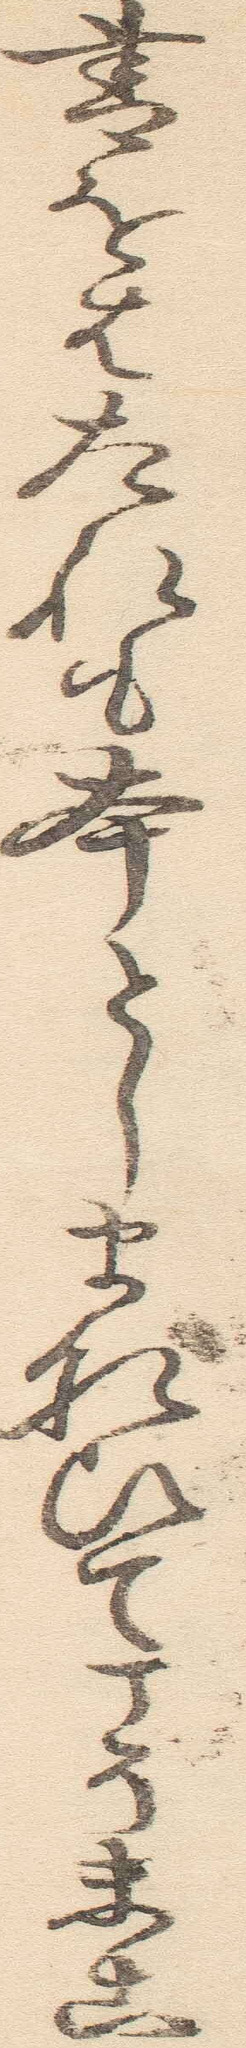書をはたれも本としまなひてこそまこ
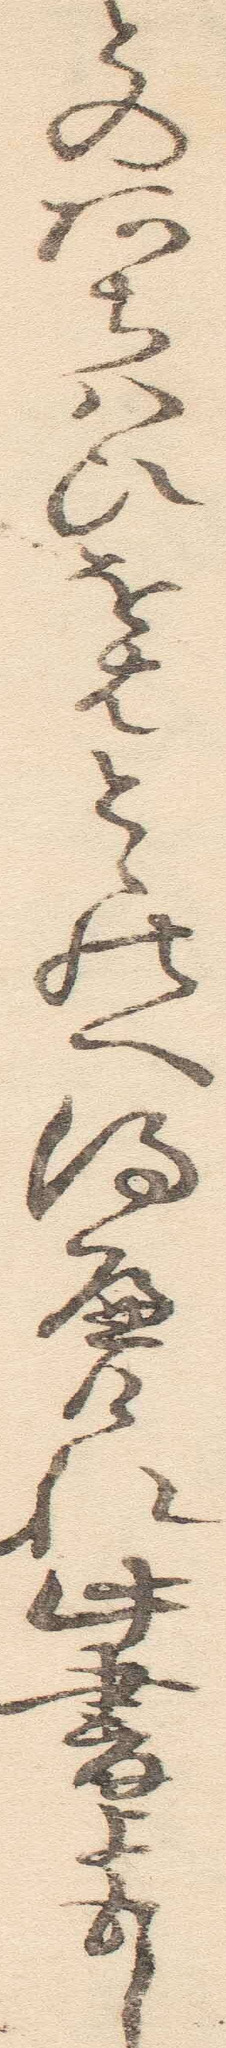とのあちはひをはとゝのへ得へけれ此書よもし
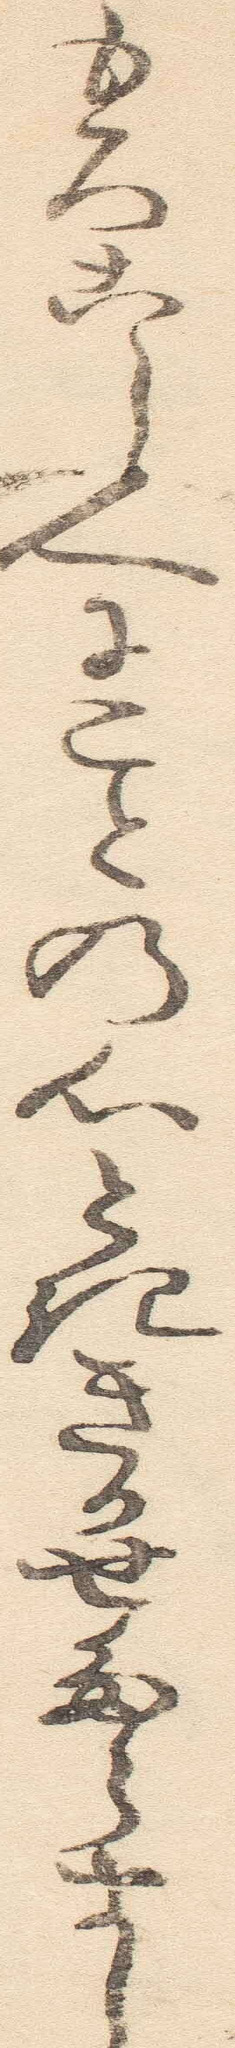もろこし人にことの心とききかせたらまし
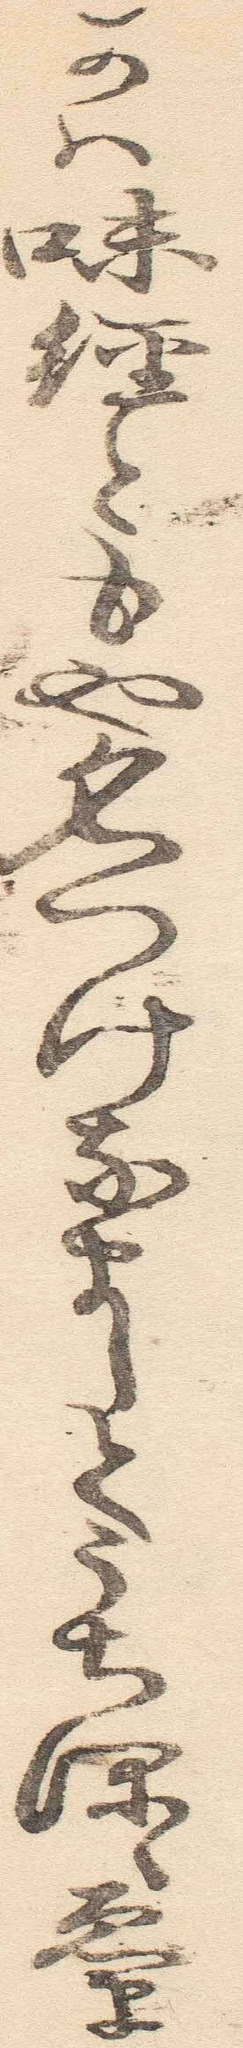かは味経ともや名つけなましとうちほゝゑま
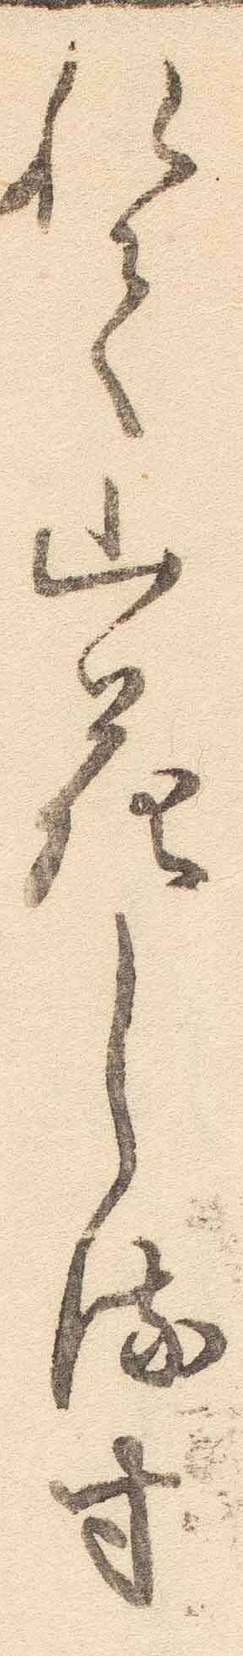れて山花しるす
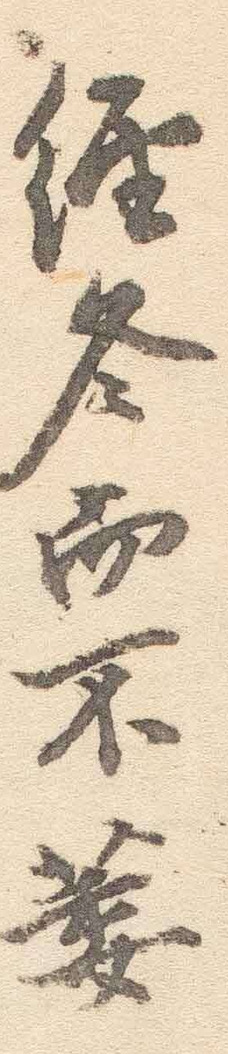経冬而不萎
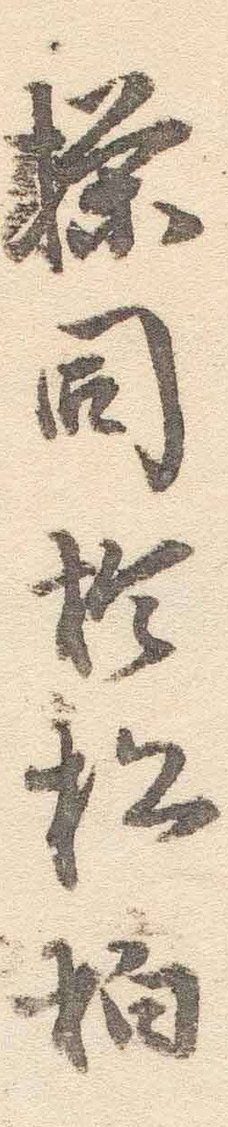採同於松柏
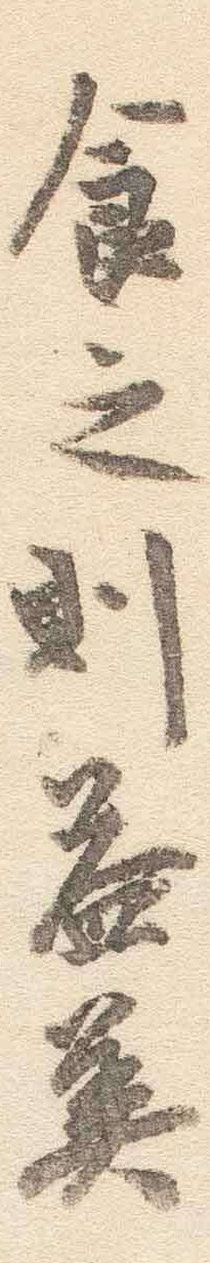食之則益美
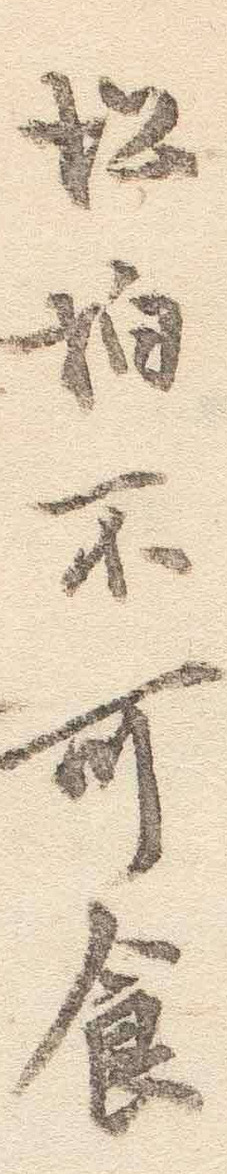松柏不可食

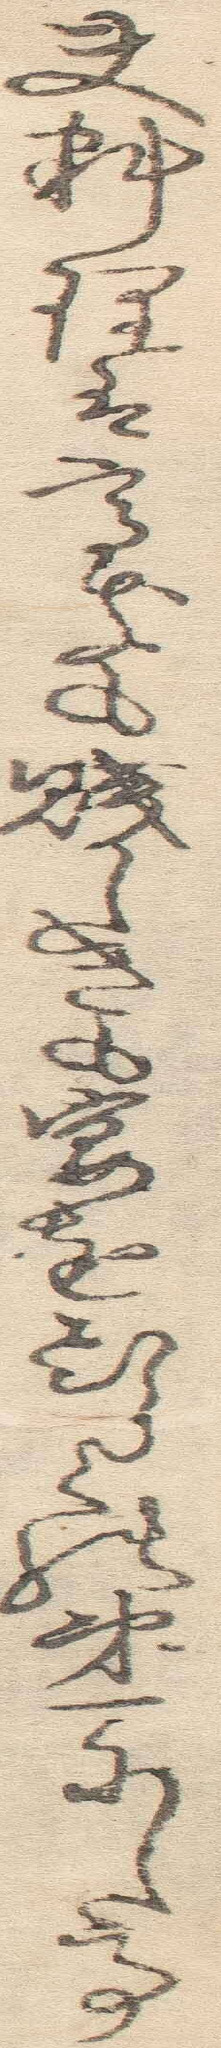夫料理は高きも賤しきも宴をひらくの第一にして
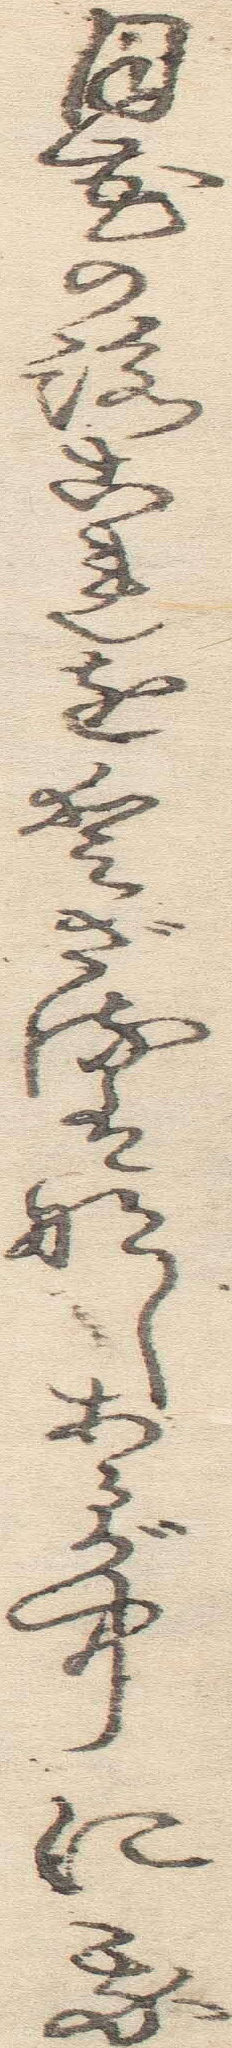月花の路これを愛ざるはなしあるが中に我
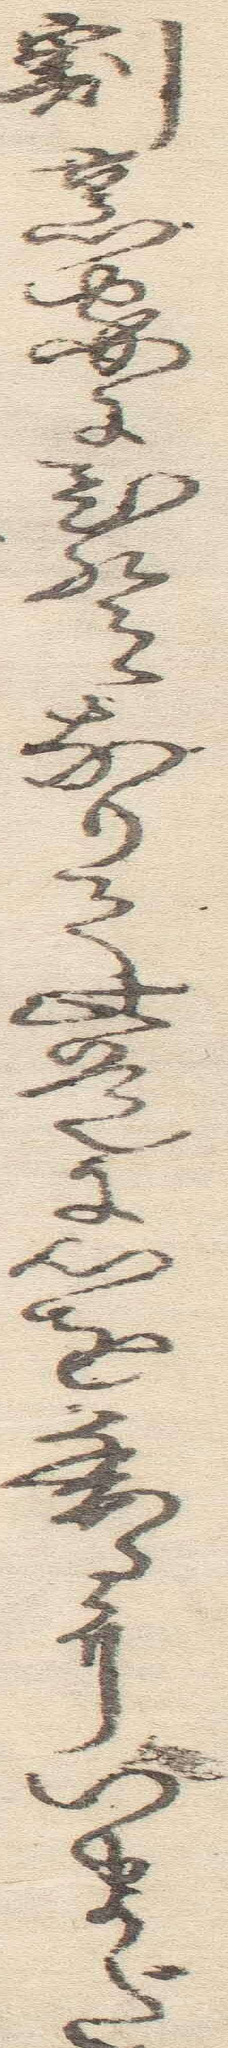割烹家にひとゝなりて此是に心を委るにいまだ
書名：料理通
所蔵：東京学芸大学附属図書館 国文学研究資料館
